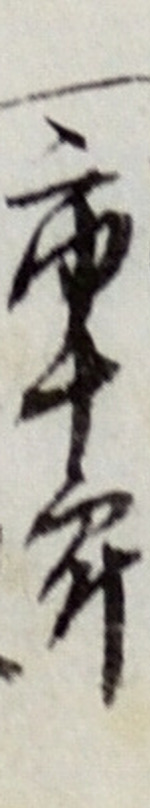市十郎
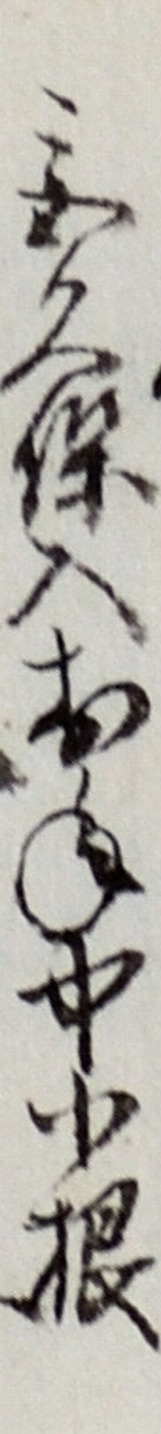宮久保入おね中小根
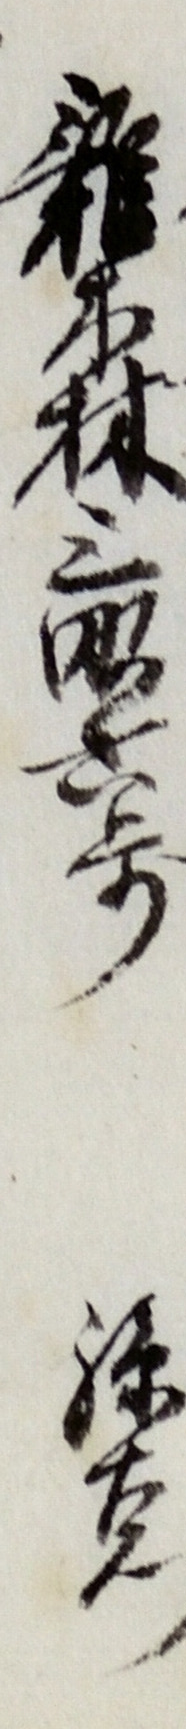雑木林三畝六歩源右衛門
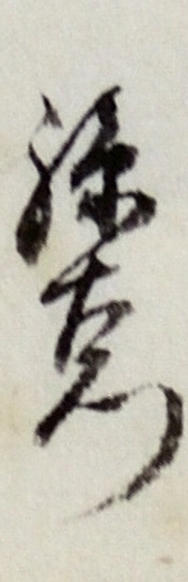平右衛門
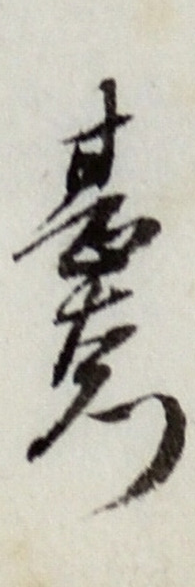平右衛門
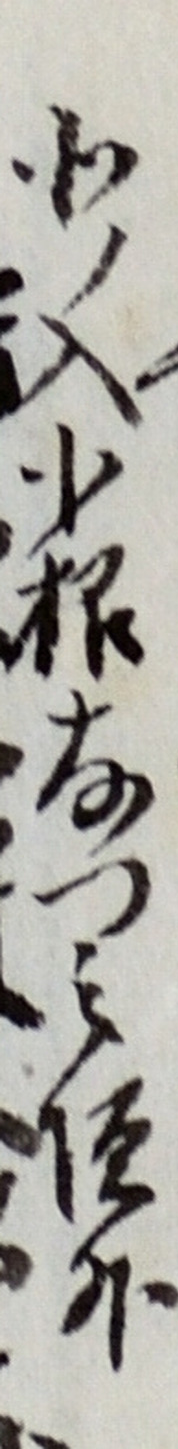北ノ入小根なつみ垣外
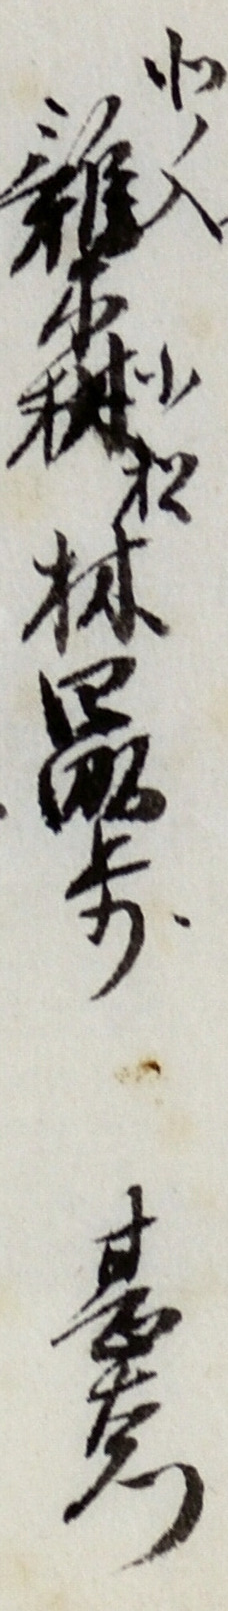雑木林四畝歩門右衛門
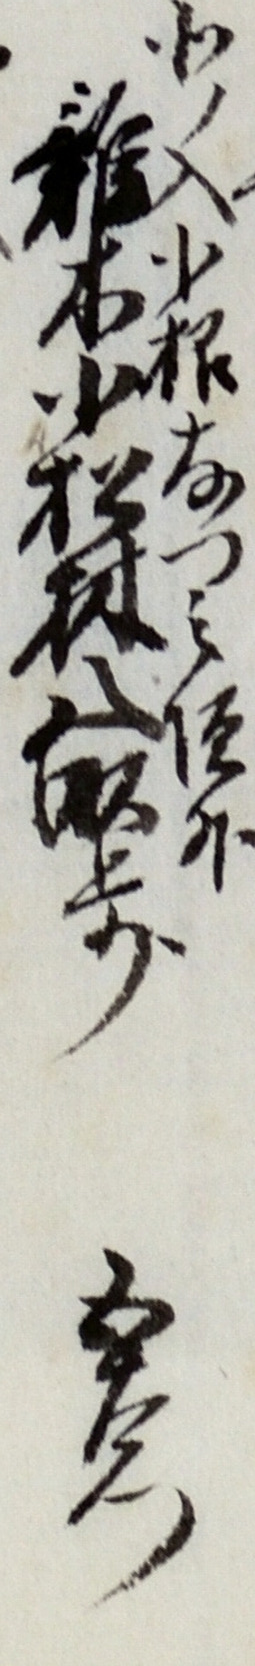雑木小松林八畝歩五右衛門
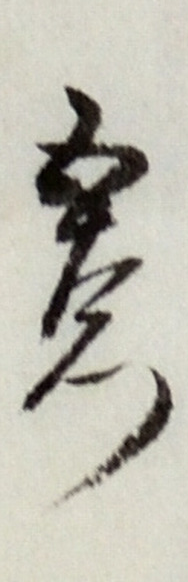平右衛門
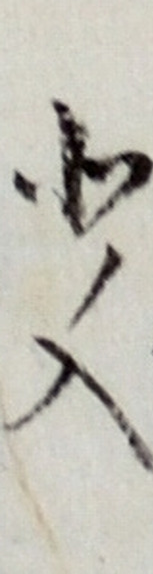北ノ入
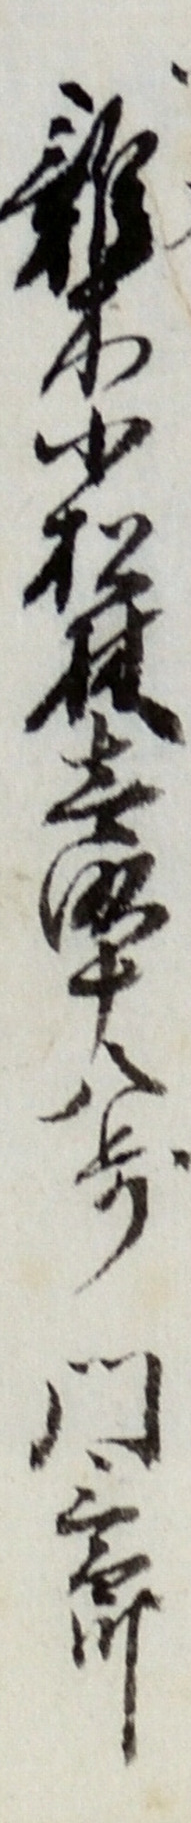雑木小松林壱畝十八歩門三郎
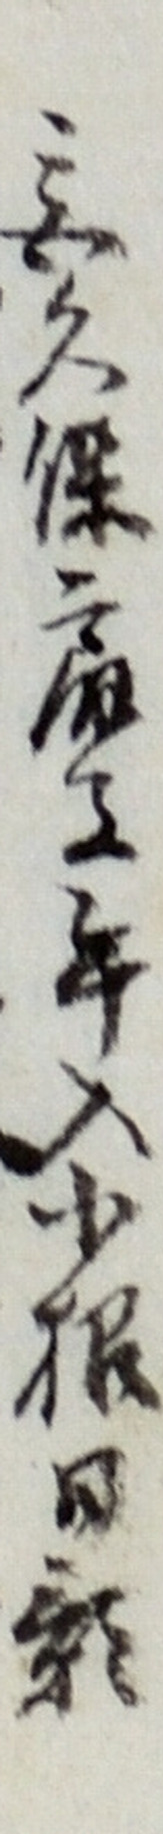宮久保扇子年入小根日影
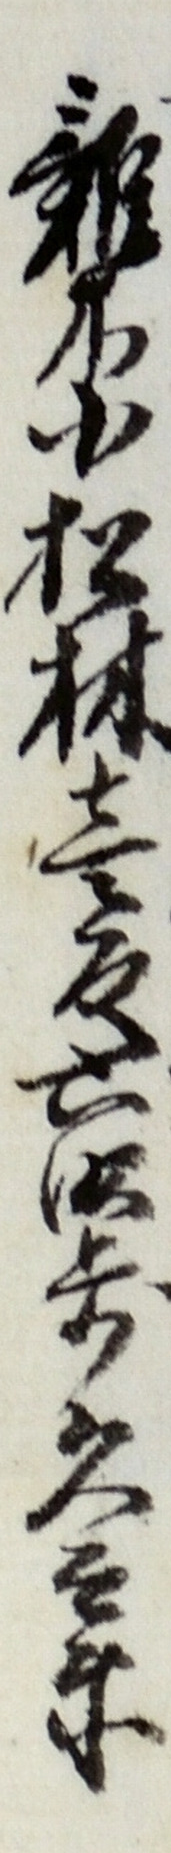雑木小松林壱反六畝歩久兵衛
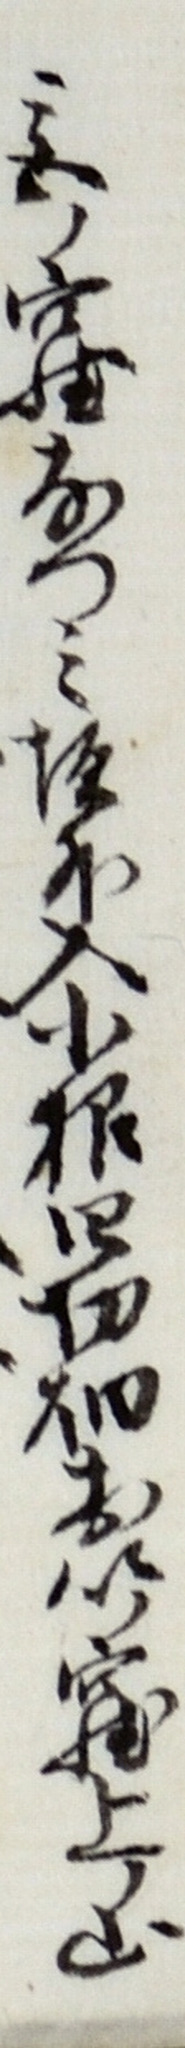宮ノ窪なつみ垣外入尾根四切畑おいノ窪上ノ山
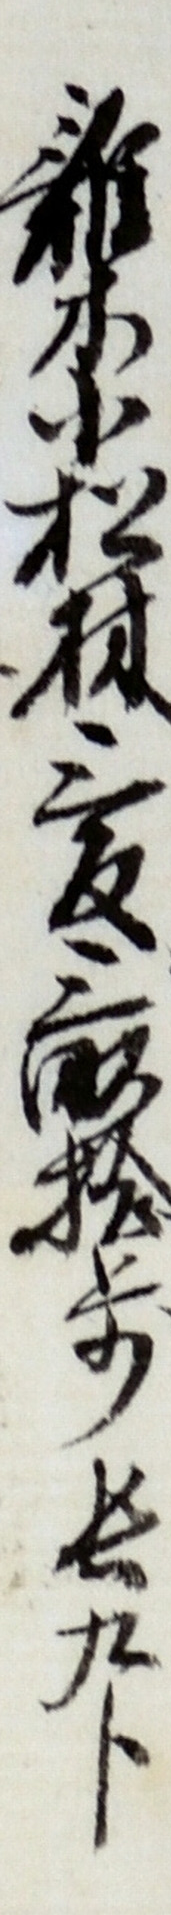雑木小松林三反三畝拾歩長九郎
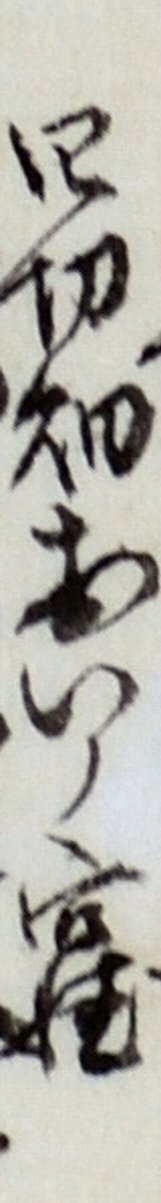四切畑おいノ窪
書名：御領分中山林社地手控
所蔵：伊那市立高遠町図書館・合同会社AMANE
